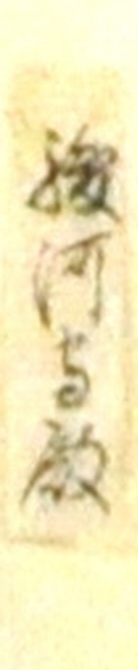駿河守殿
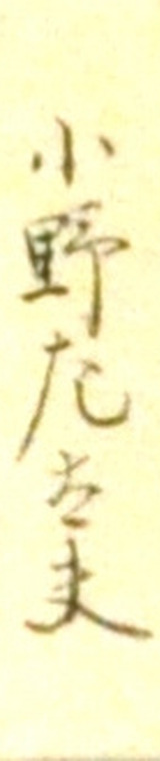小野左太夫

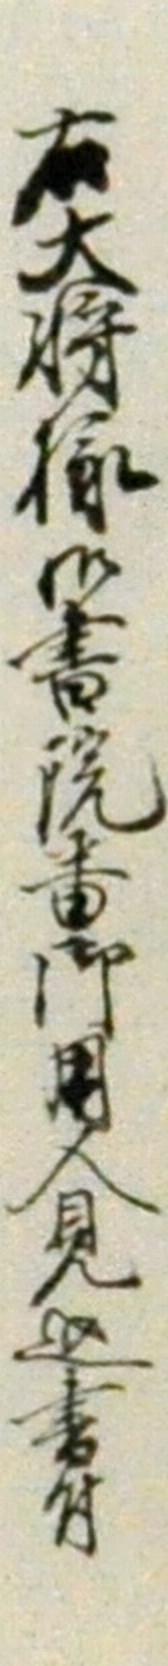右大将様御書院番御用人見込書付
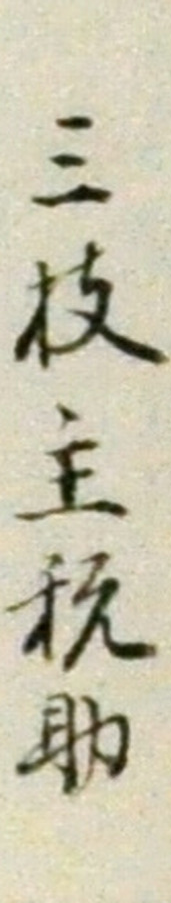三枝主税助
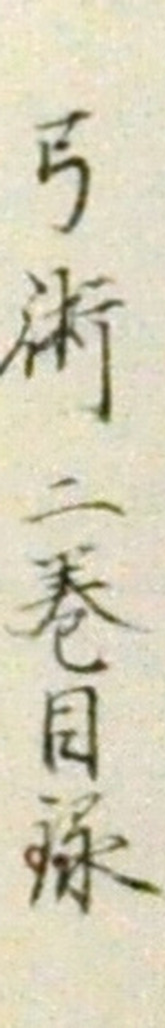弓術二巻目録
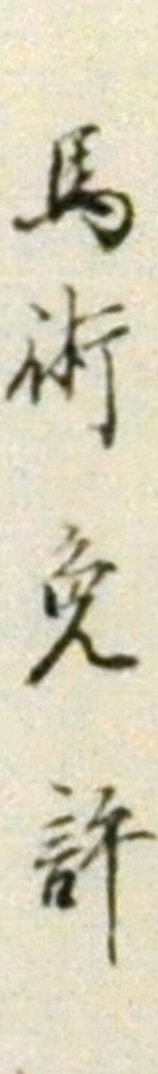馬術免許
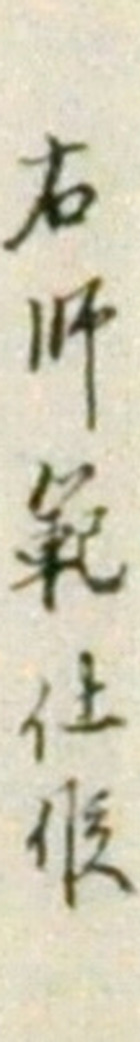右師範仕候
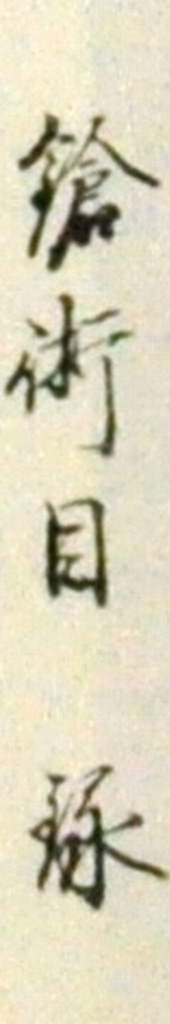鎗術目録
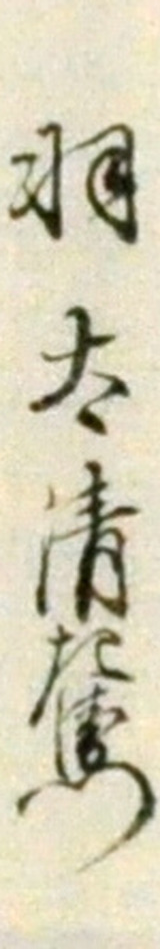羽太清左衛門
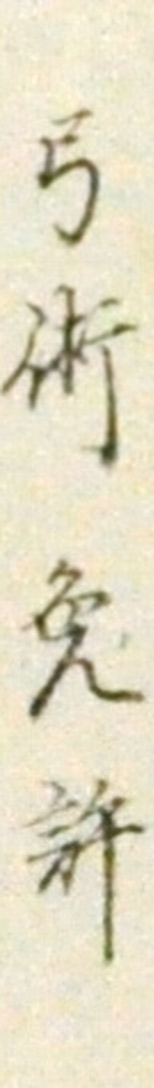弓術免許
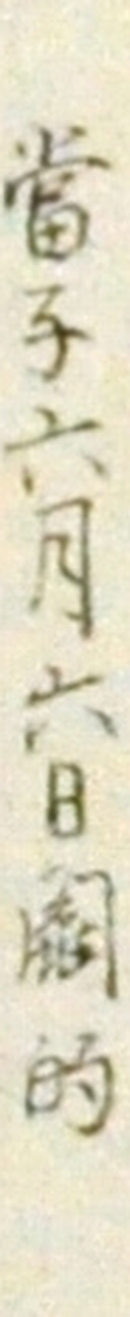当子六月六日鬮的
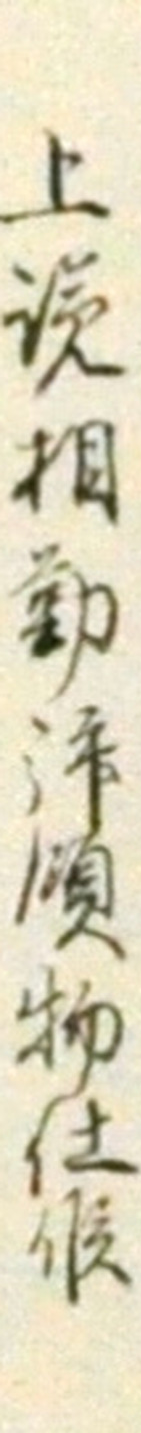上覧相勤拝領物仕候
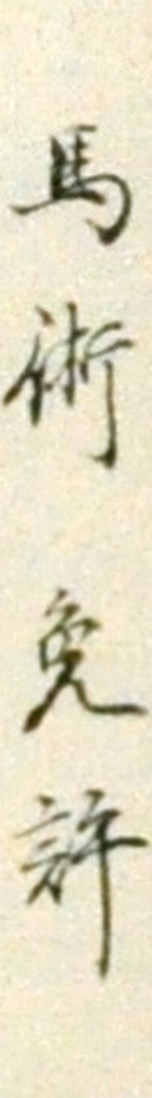馬術免許
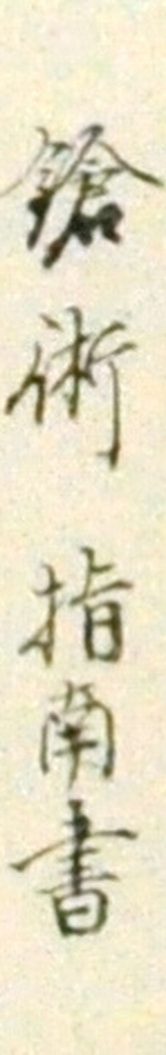鎗術指南書
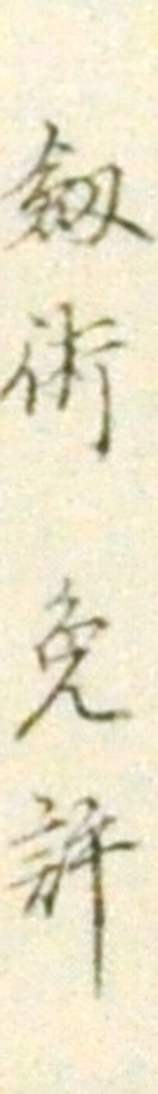馬術免許
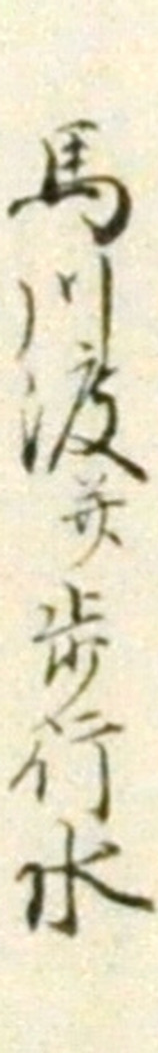馬川渡并歩行水
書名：右大将様御書院番御用人見込書付
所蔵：伊那市立高遠町図書館・合同会社AMANE
